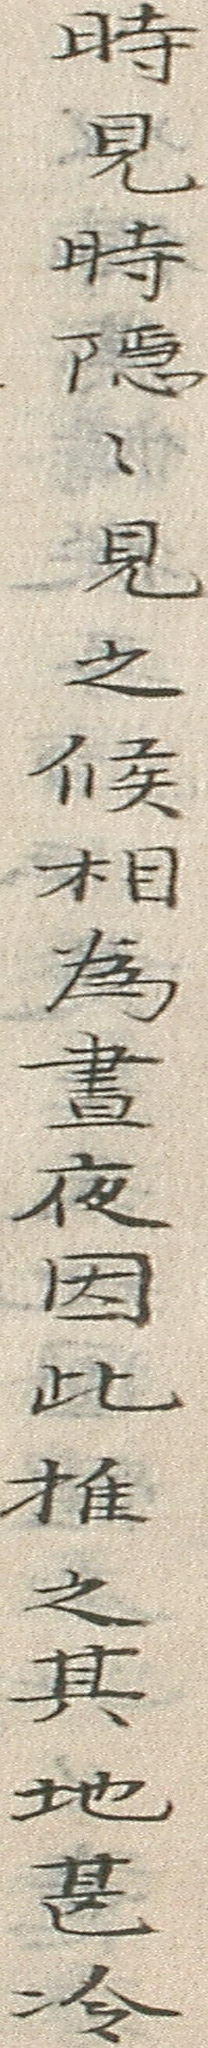時見時隠〻見之候相為昼夜因此推之其地甚冷
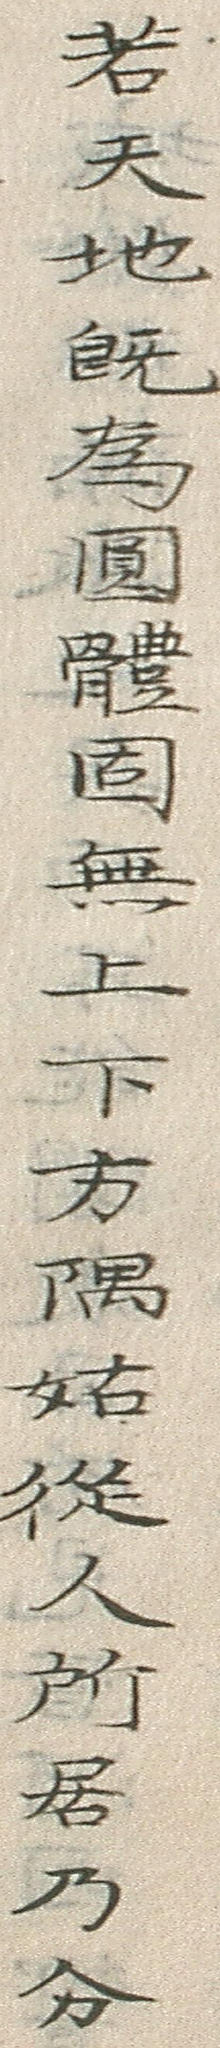若天地既為円体固無上下方隅姑従人所居乃分
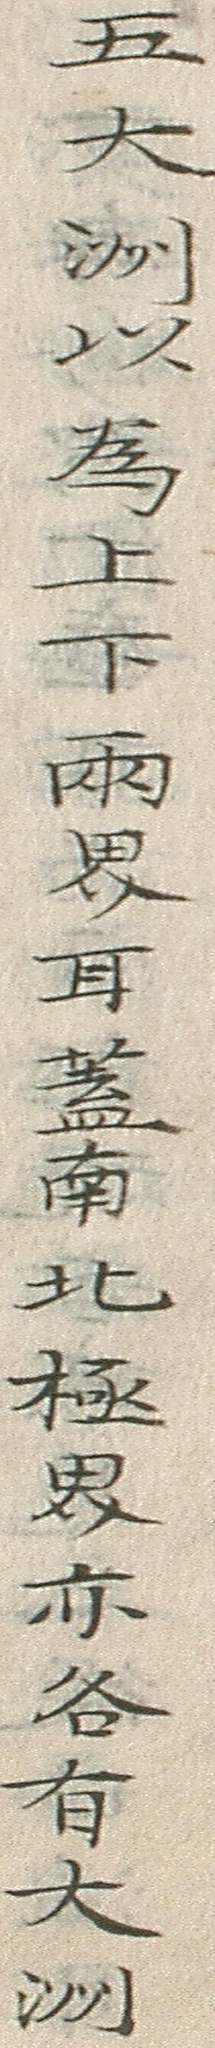五大洲以為上下両界耳蓋南北極界亦各有大洲
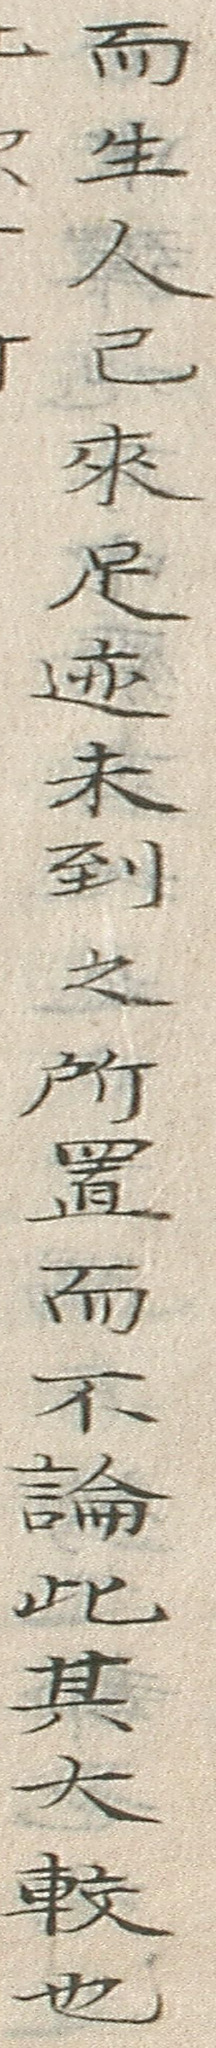而生人己来足迹未到之所置而不論此其大較也
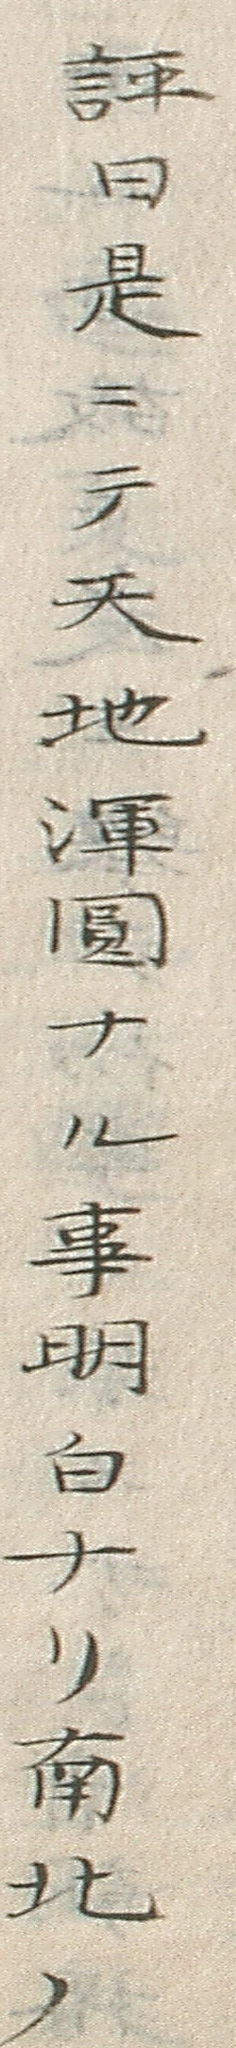評曰是ニテ天地渾円ナル事明白ナリ南北ノ
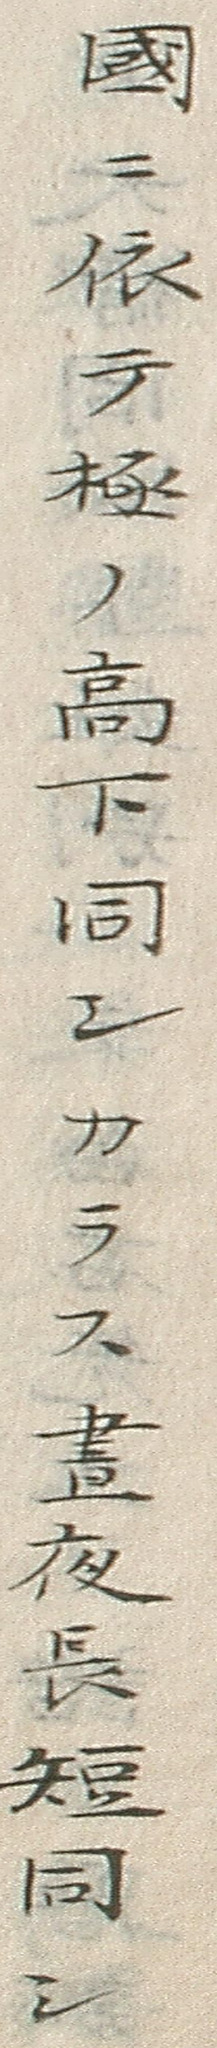国ニ依テ極ノ高下同シカラス昼夜長短同シ
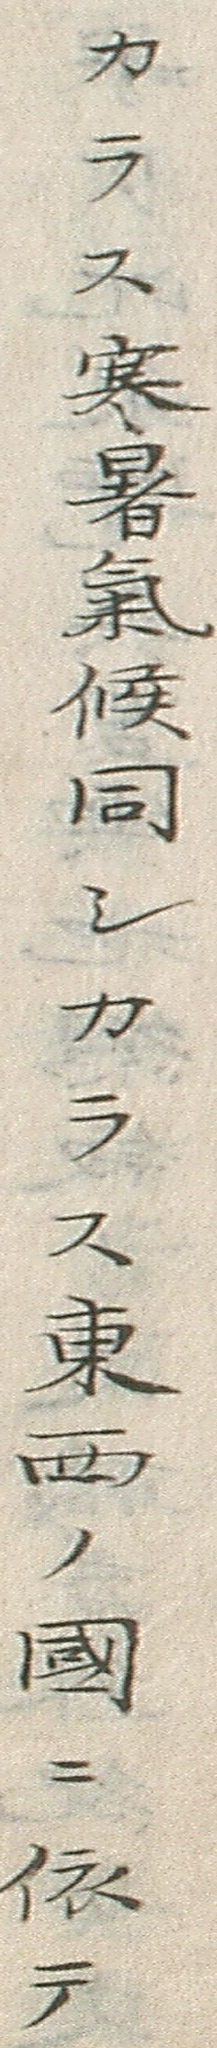カラス寒暑気候同シカラス東西ノ国ニ依テ
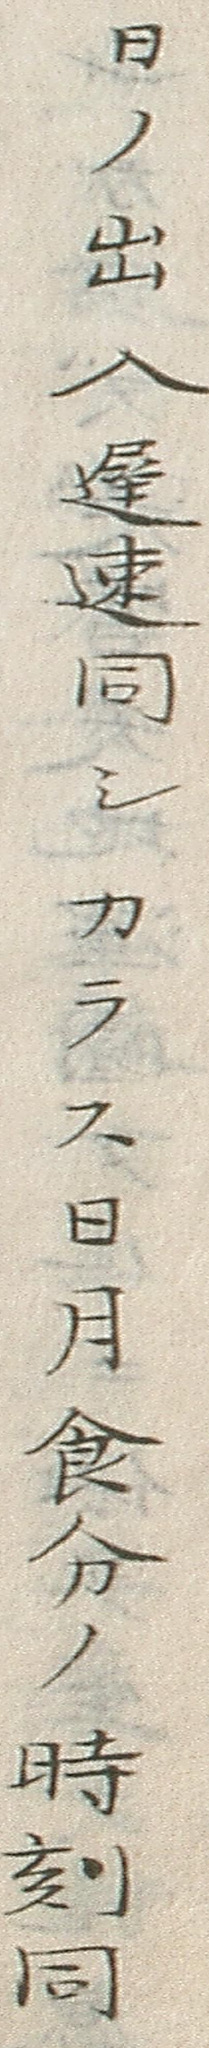日ノ出入遅速同シカラス日月食分ノ時刻同

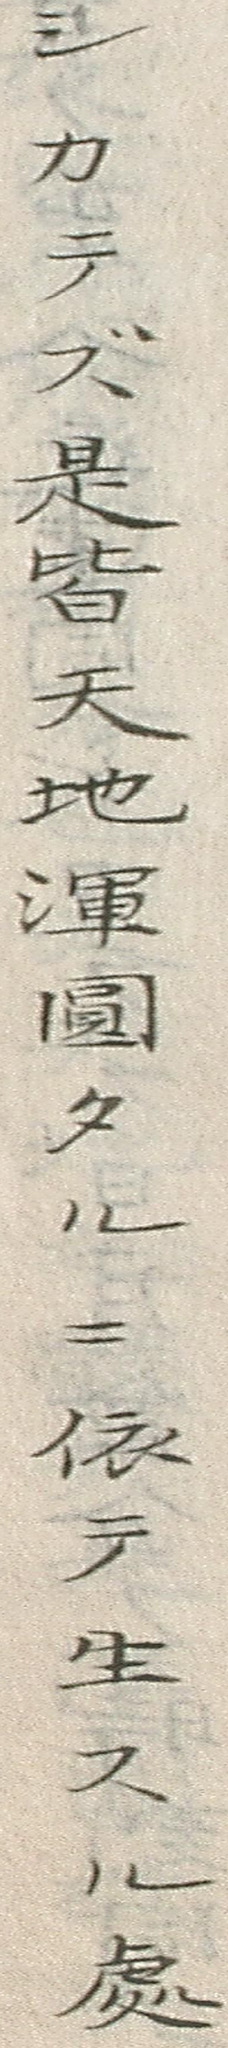シカラズ是皆天地渾円タルニ依テ生スル処
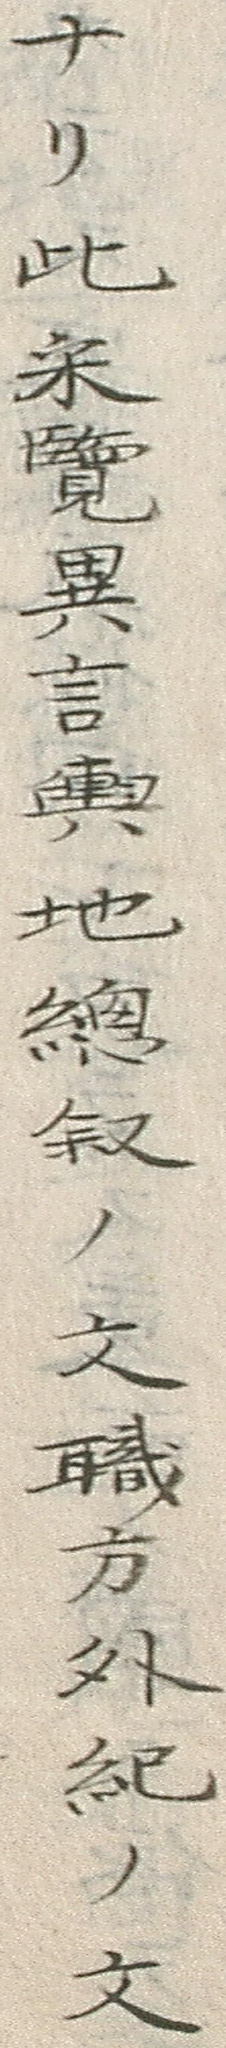ナリ此采覧異言輿地総叙ノ文職方外紀ノ文
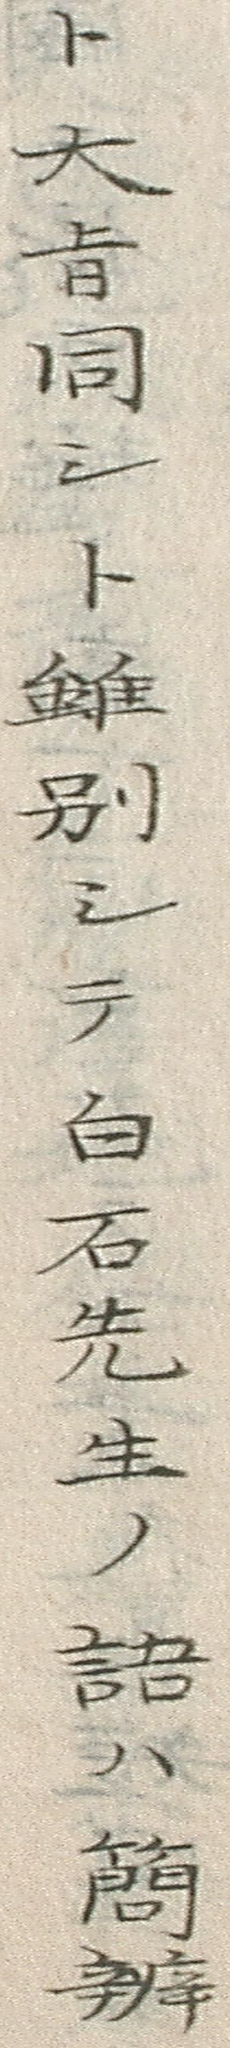ト大旨同シト雖別シテ白石先生ノ語ハ簡弁
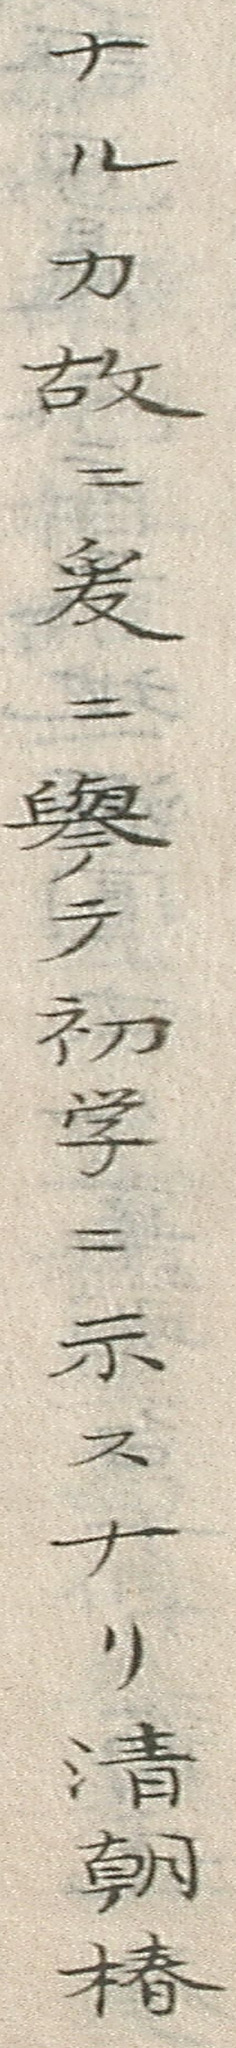ナルカ故ニ爰ニ挙テ初学ニ示スナリ清朝椿
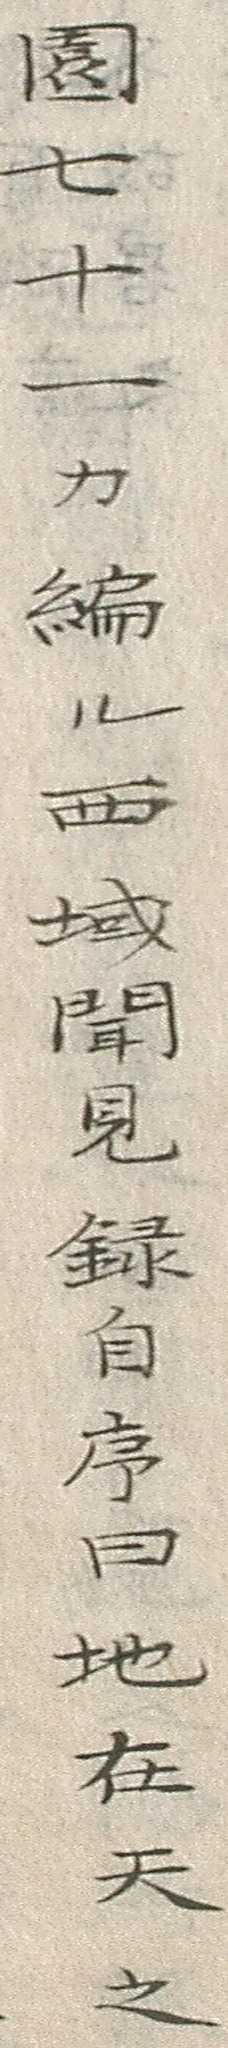園七十一ヵ編ル西域聞見録自序曰地在天之
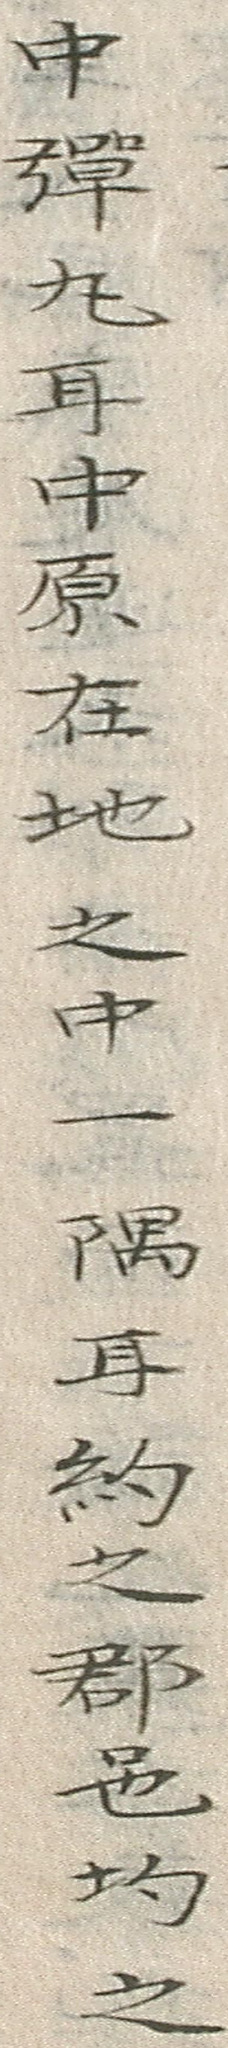中弾丸耳中原在地之中一隅耳約之郡邑均之
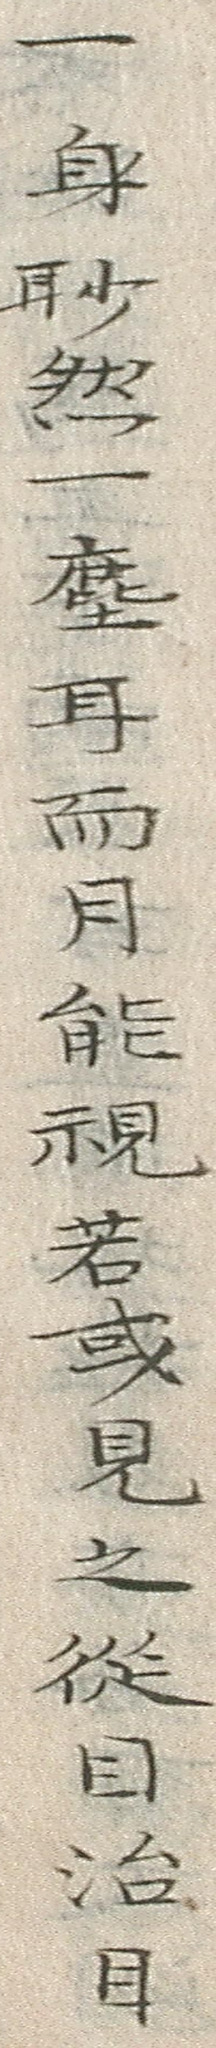一身眇然一塵耳而月能視若或見之従目治目
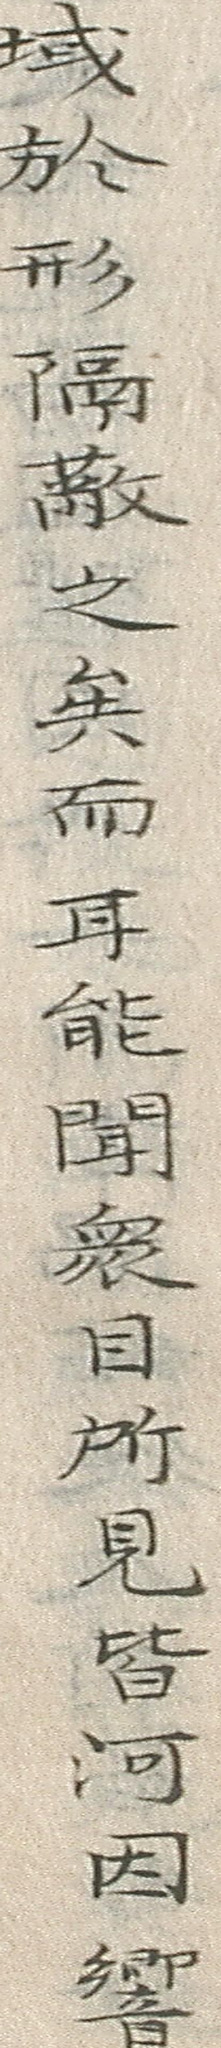域於形隔蔽之矣而耳能聞衆目所見皆河因響
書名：天學略名目羽翼　全
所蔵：東京大学地震研究所図書室 Earthquake Research Institute Library, The University of Tokyo, JAPAN
